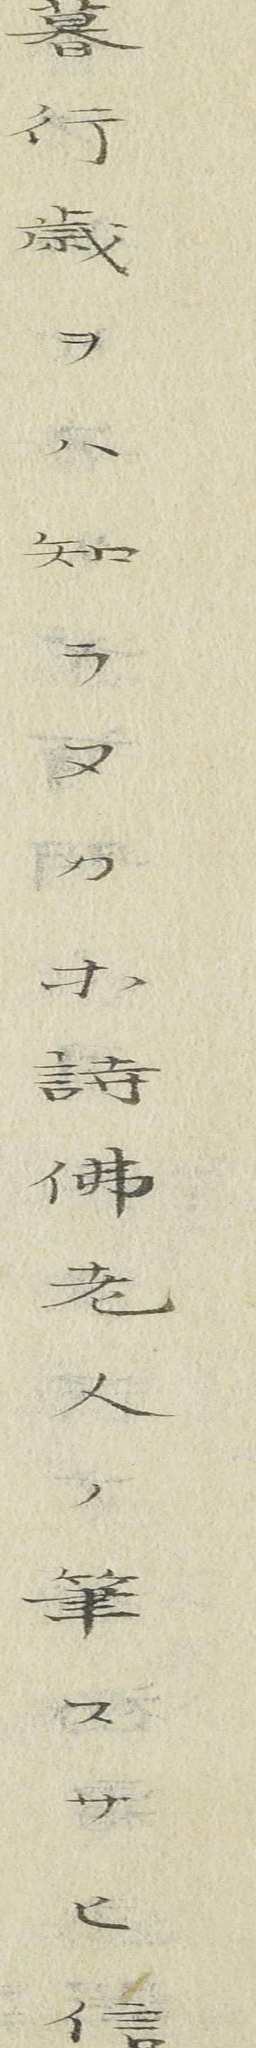暮行歳ヲハ知ラヌカホ詩仏老人ノ筆スサヒ信
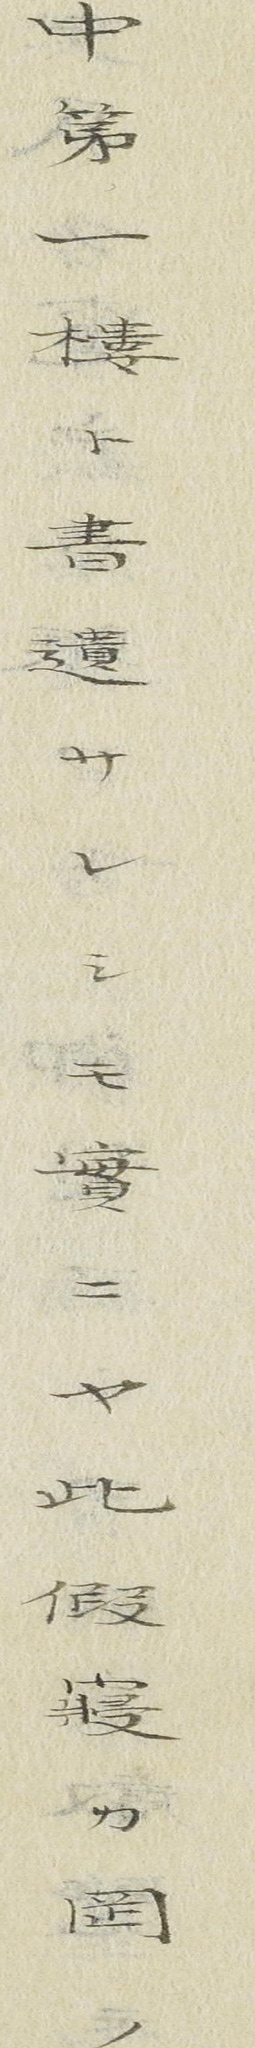中第一樓ト書遺サレシモ実ニヤ此仮寝カ岡ノ
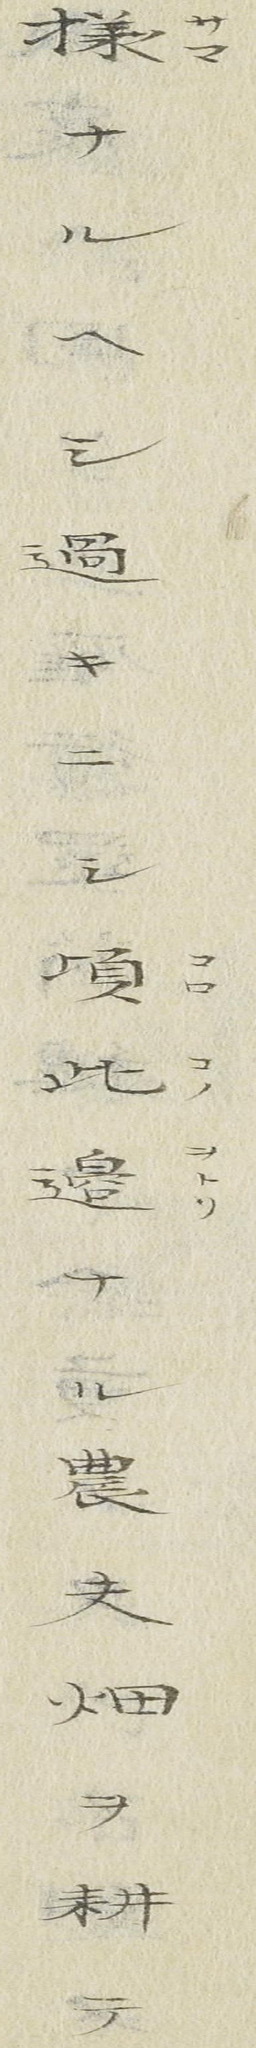様ナルヘシ過キニシ頃此辺ナル農夫畑ヲ耕テ
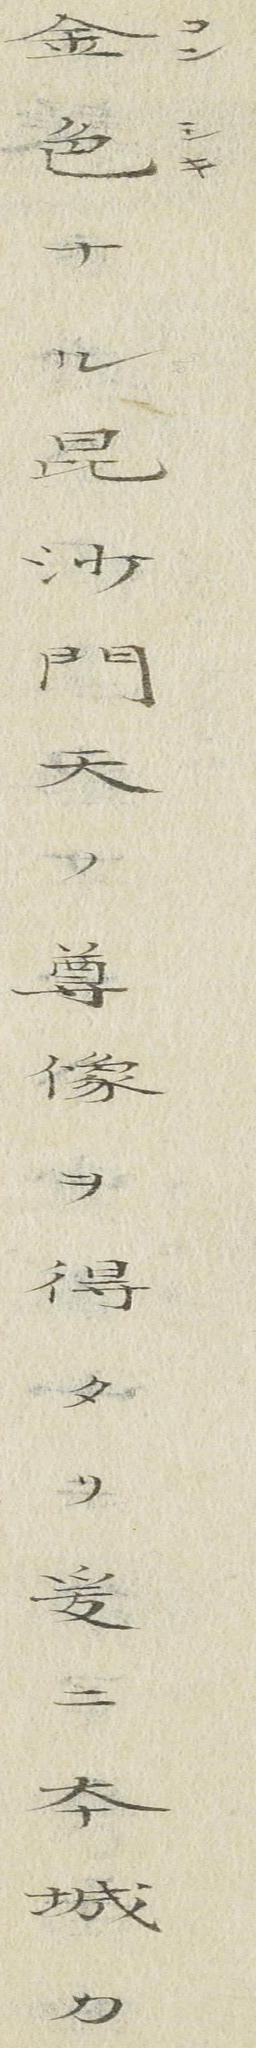金色ナル毘沙門天ノ尊像ヲ得タリ爰ニ本城カ
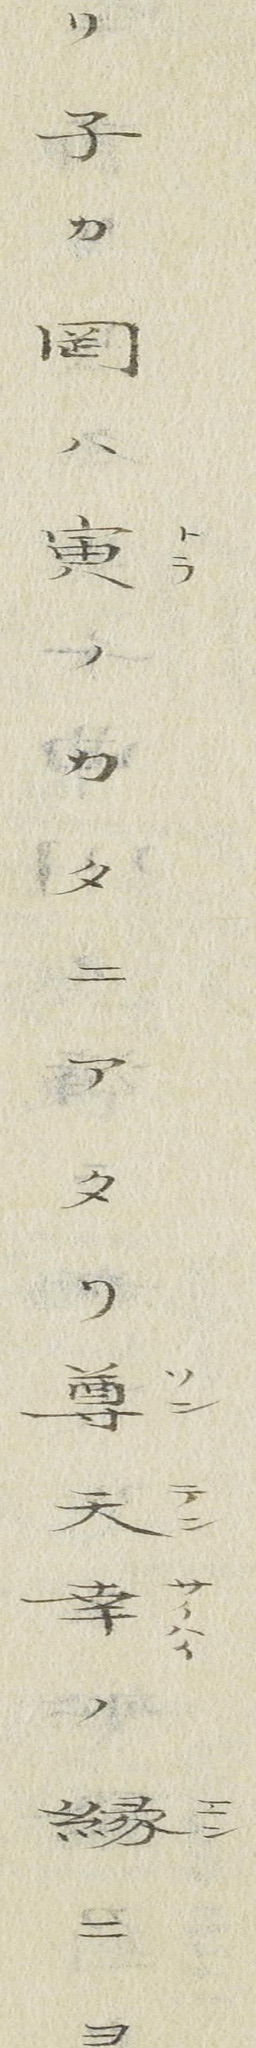リ子カ岡ハ寅ノカタニアタリ尊天幸ノ縁ニヨ
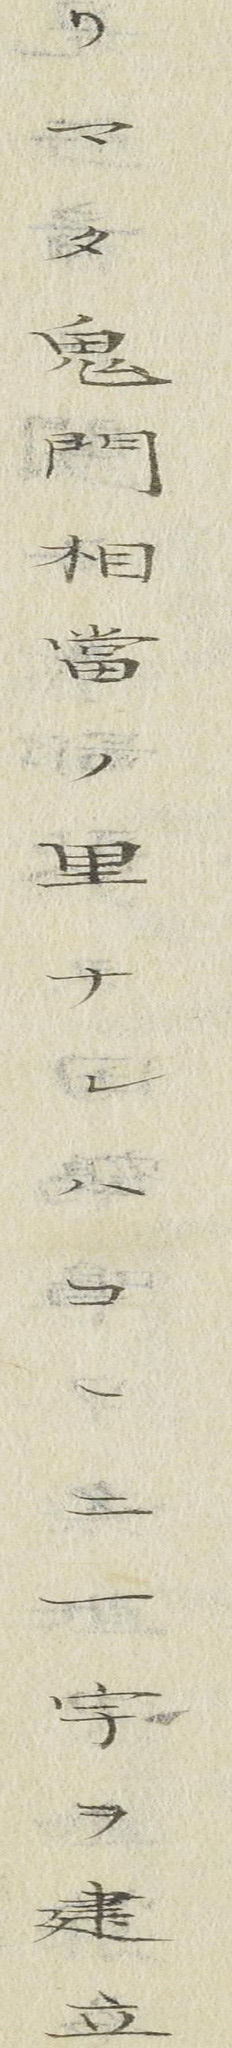リマタ鬼門相当ノ里ナレハコヽニ一宇ヲ建立
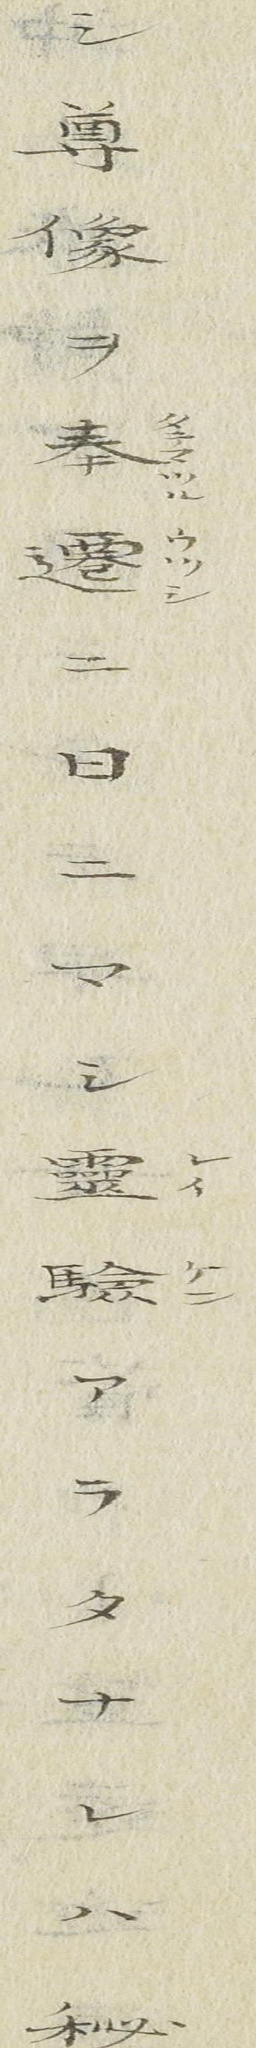シ尊像ヲ建遷ニ日ニマシ霊験アラタナレハ秘
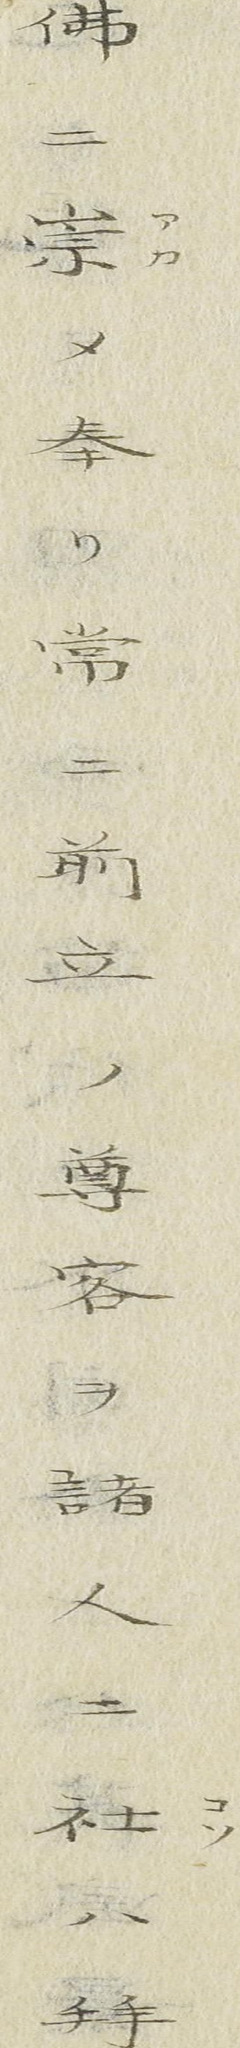仏ニ崇メ奉リ常ニ前立ノ尊客ヲ諸人ニ社ハ拝
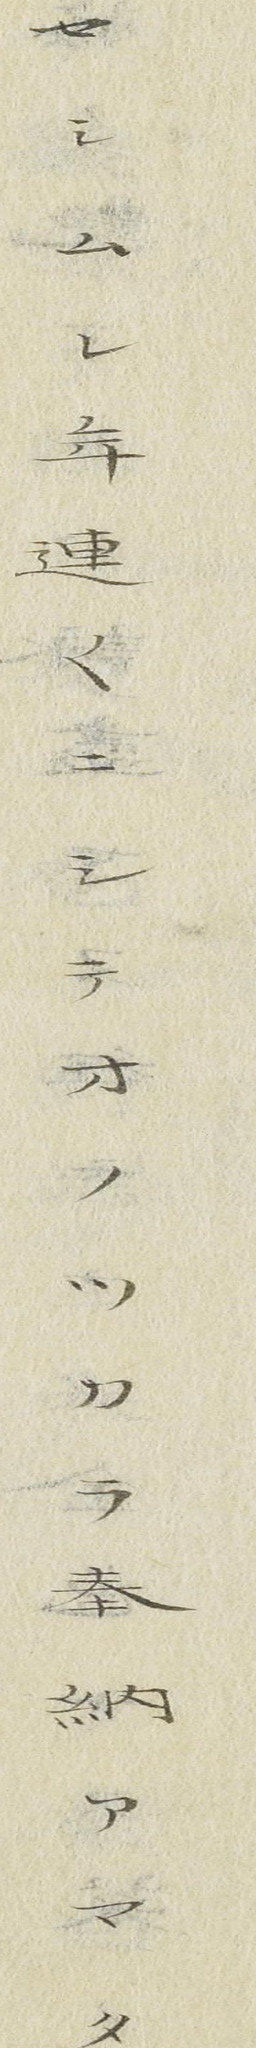セシムレ年連〱ニシテオノツカラ奉納アマタ
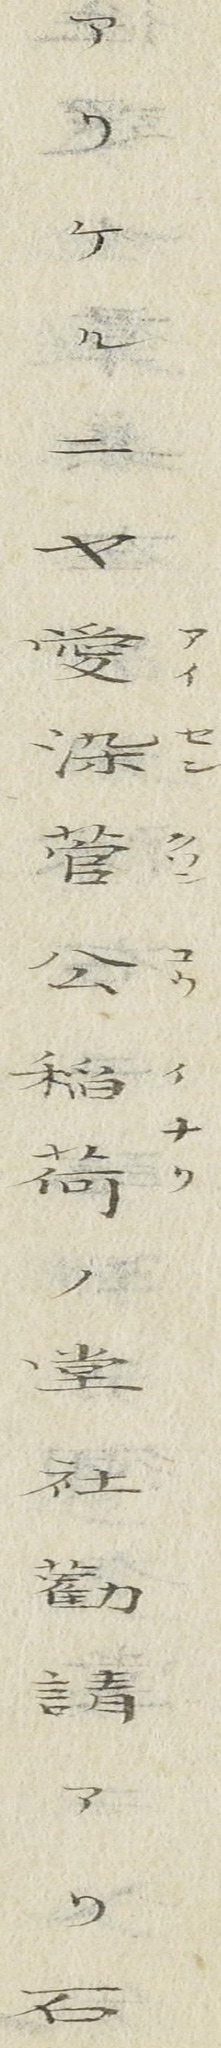アリケルニヤ愛染菅公稲荷ノ堂社勧請アリ石
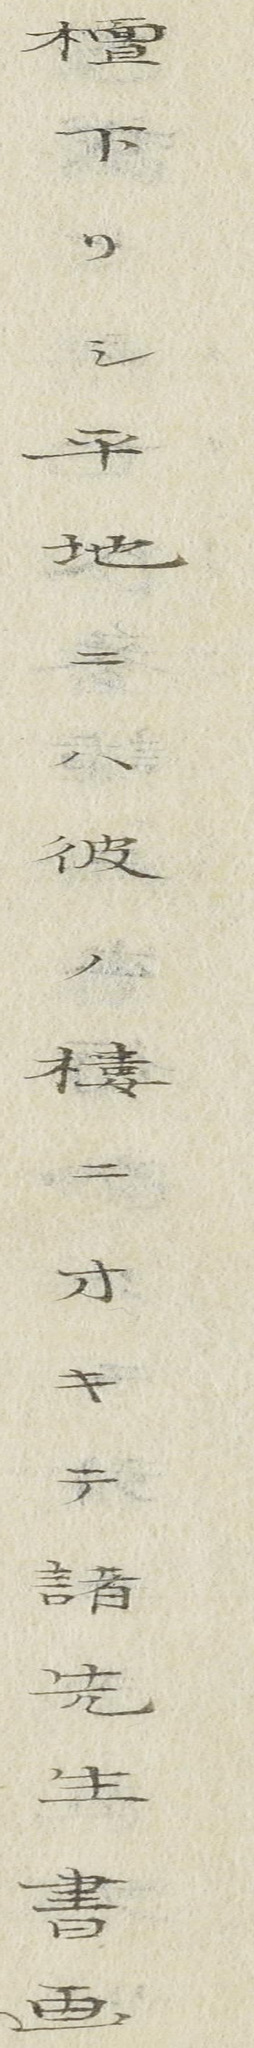檀下リシ平地ニハ彼ノ楼ニオキテ諸先生書画
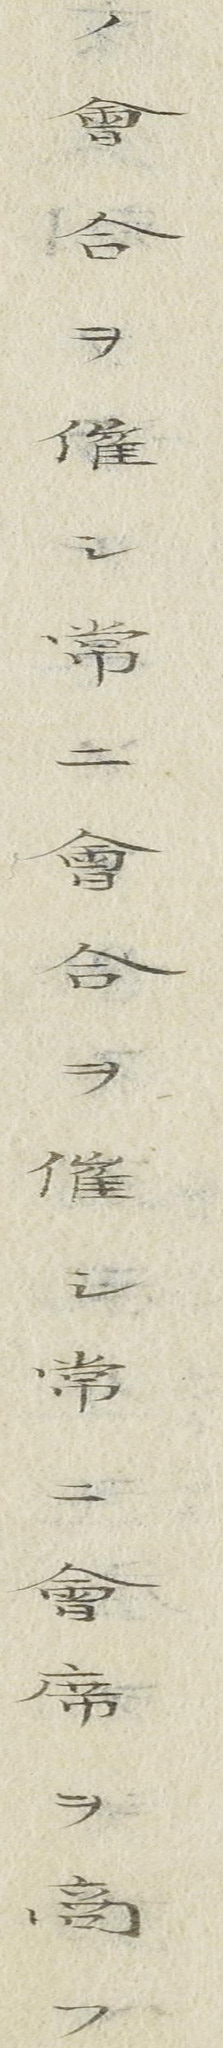ノ会合ヲ催シ常ニ会合ヲ催シ常ニ会席ヲ商フ
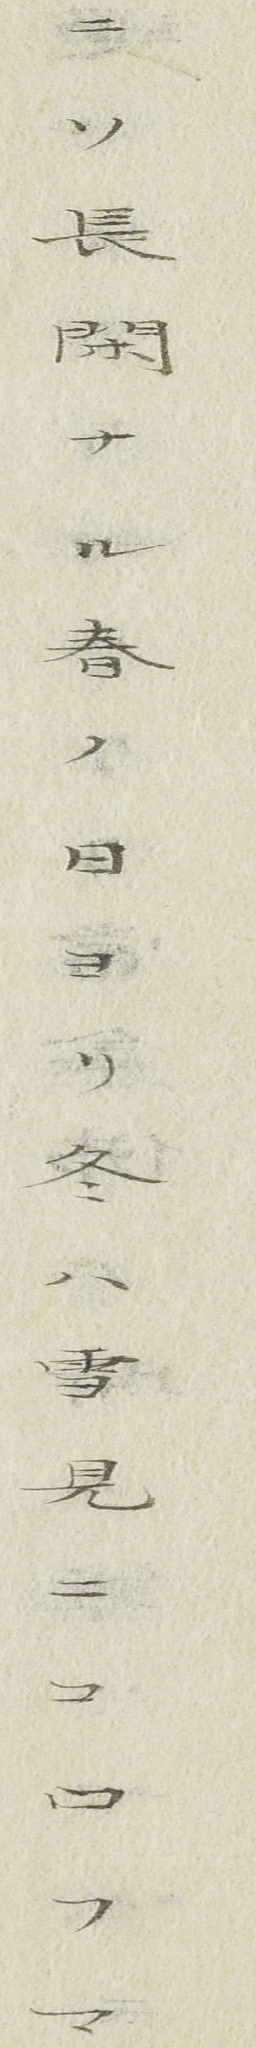ニソ長閑ナル春ノ日ヨリ冬ハ雪見ニコロフマ
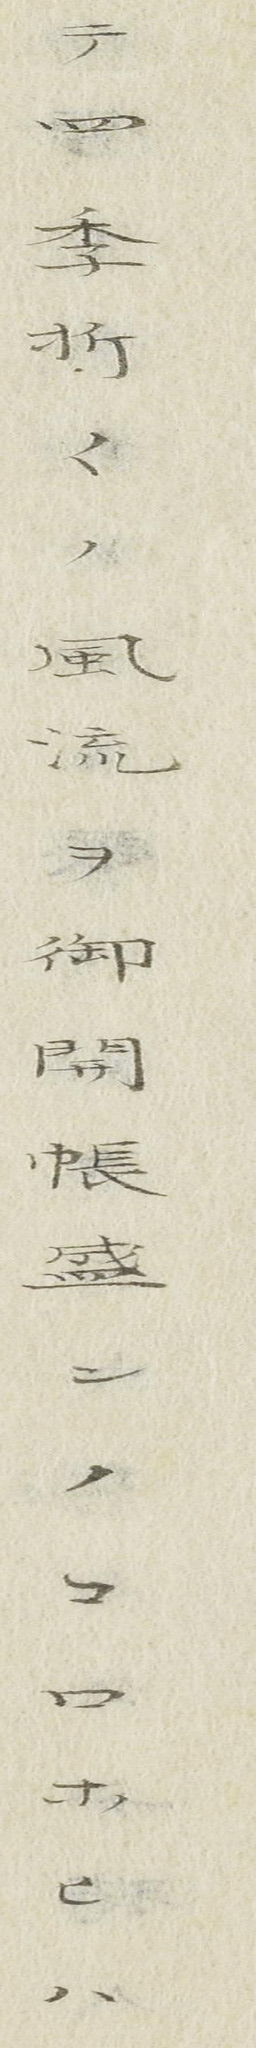テ四季折〱ノ風流ヲ御開帳盛ンノコロホヒハ
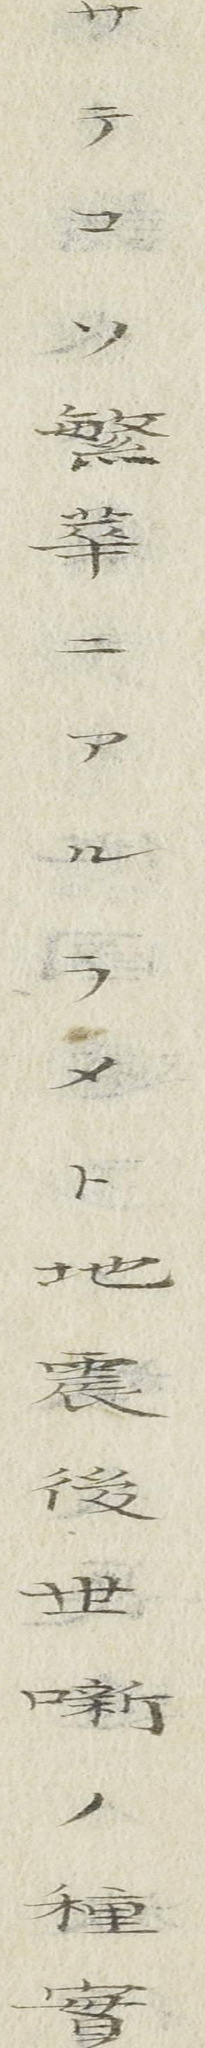サテコソ繁華ニアルラメト地震後世噺ノ種実
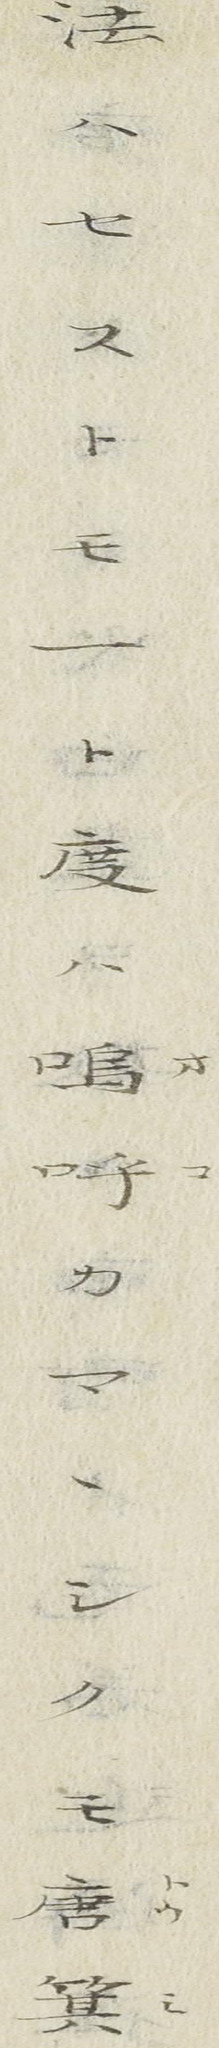法ハセストモ一ト度ハ嗚呼カマヽシクモ唐箕
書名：地災撮要　地震之部　巻ノ二
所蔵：東京大学地震研究所図書室 Earthquake Research Institute Library, The University of Tokyo, JAPAN
